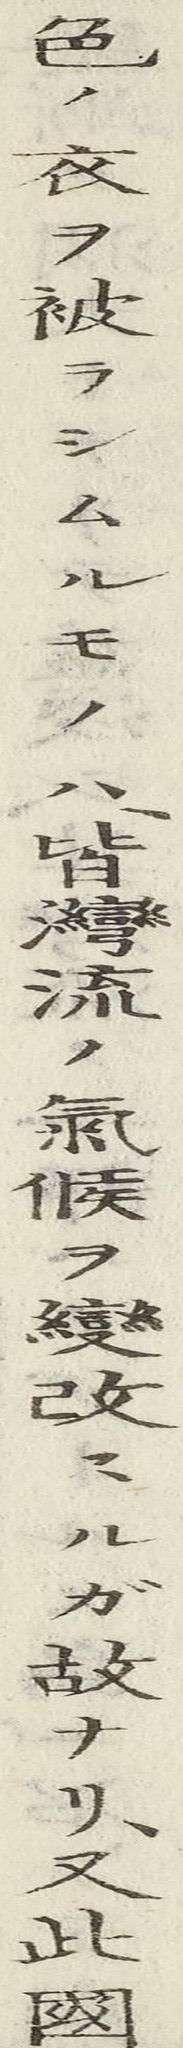色ノ衣ヲ被ラシムルモノハ、皆湾流ノ気候ヲ変改スルガ故ナリ、又此国
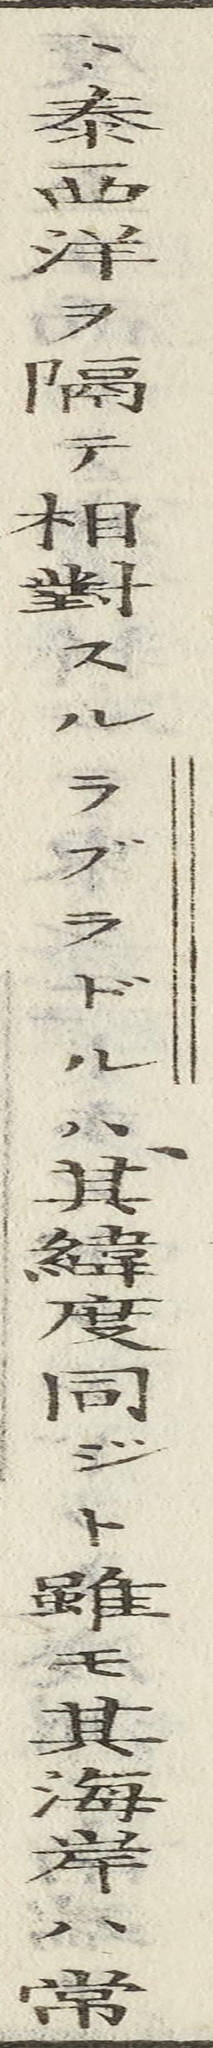ハ泰西洋ヲ隔テ相対スルラブラドルハ、其緯度同ジト雖モ其海岸ハ常
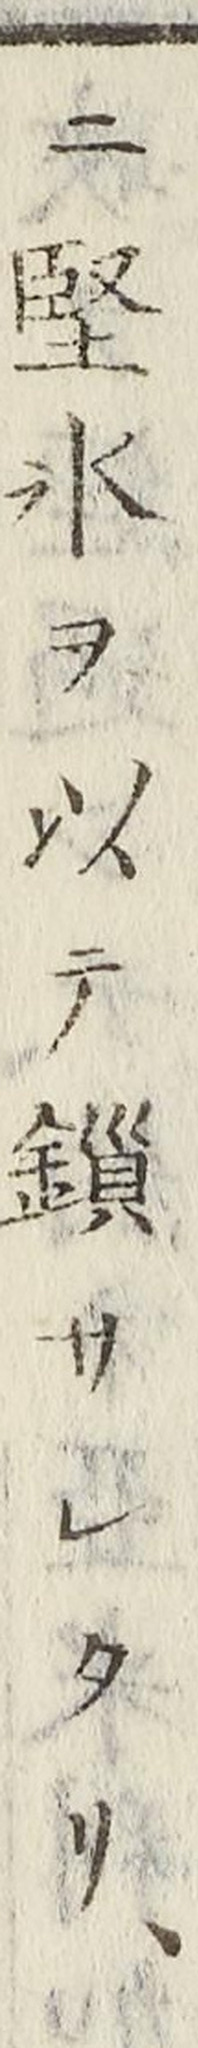ニ堅氷ヲ以テ鎖サレタリ、
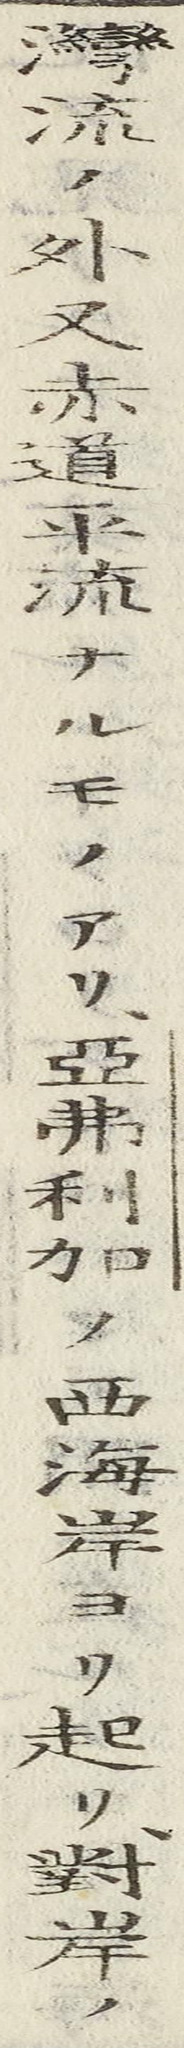湾流ノ外又赤道平流ナルモノアリ、阿弗利加ノ西海岸ヨリ起リ、対岸ノ
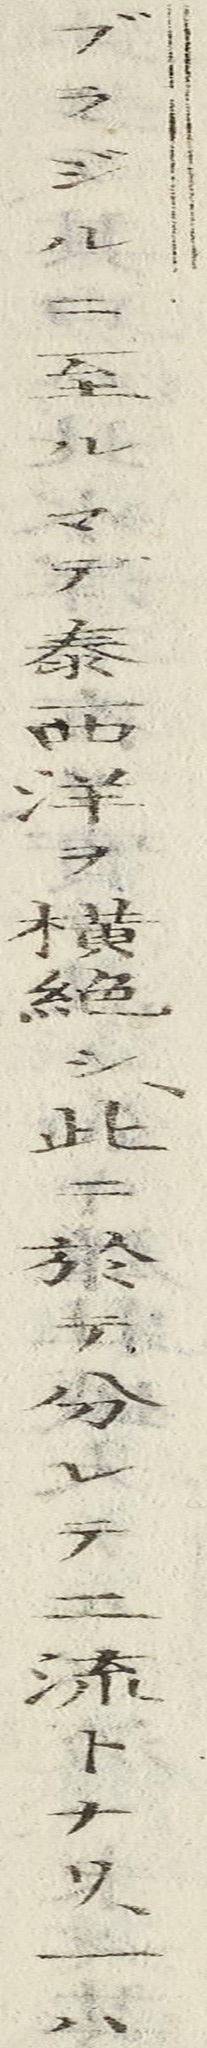ブラジルニ至ルマデ泰西洋ヲ横絶シ、此ニ於テ分レテ二流トナリ、一ハ
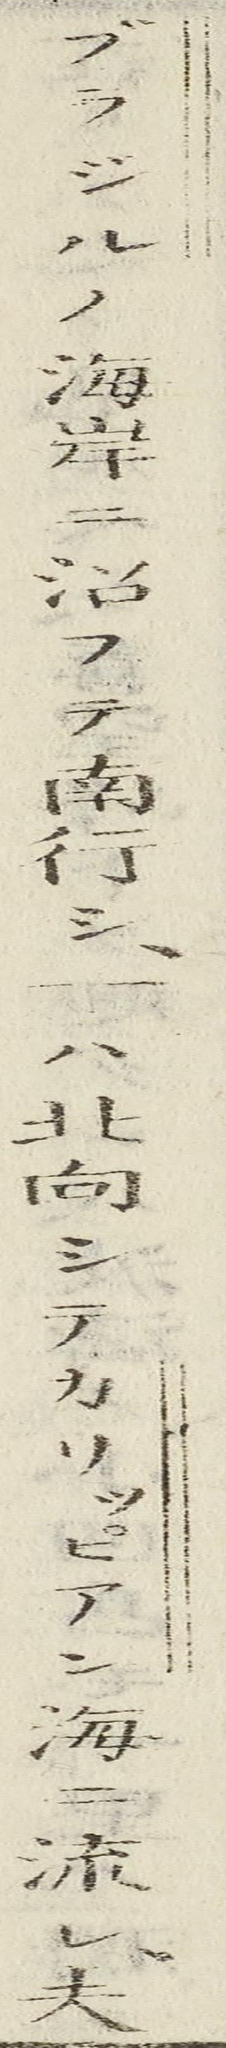ブラジルノ海岸ニ沿フテ南行シ、一ハ北向シテカリッピアン海ニ流レ、夫
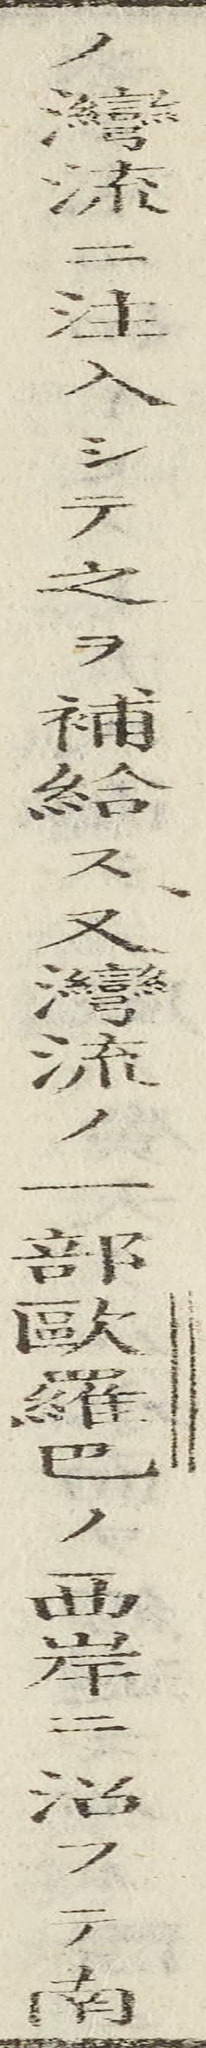ノ湾流ニ注入シテ之ヲ補給ス、又湾流ノ一部欧羅巴ノ西岸ニ沿フテ南
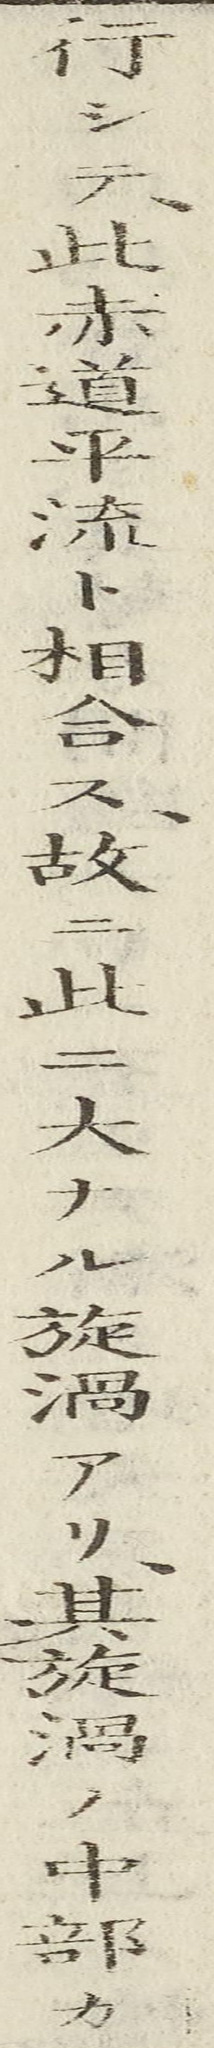行シテ、此赤道平流ト相合ス、故ニ此ニ大ナル旋渦アリ、其旋渦ノ中部カ
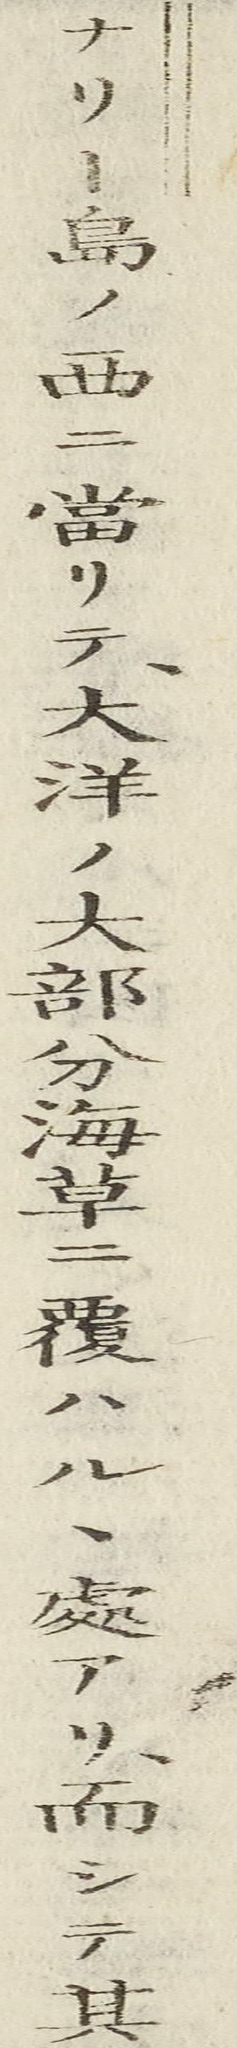ナリー島ノ西ニ当リテ、大洋ノ大部分海草ニ覆ハルヽ処アリ、而シテ其
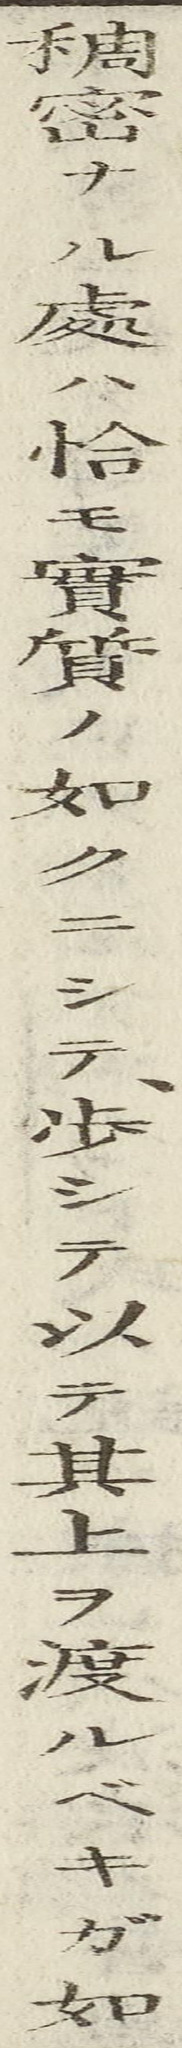稠密ナル処ハ恰モ実質ノ如クニシテ、歩シテ以テ其上ヲ渡ルベキガ如
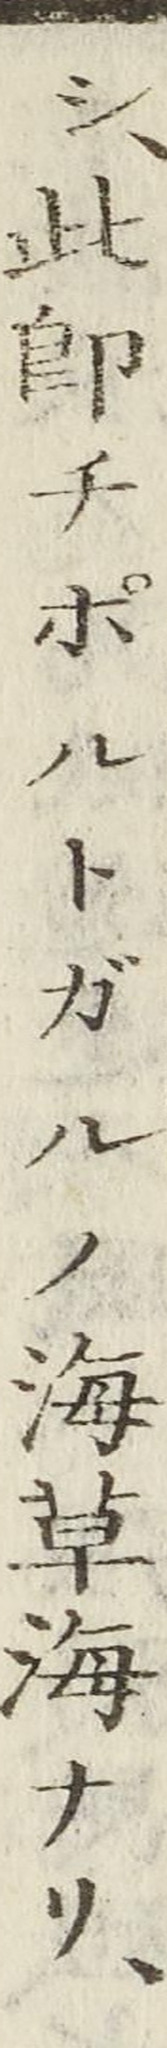シ、此即チポルトガルノ海草海ナリ、
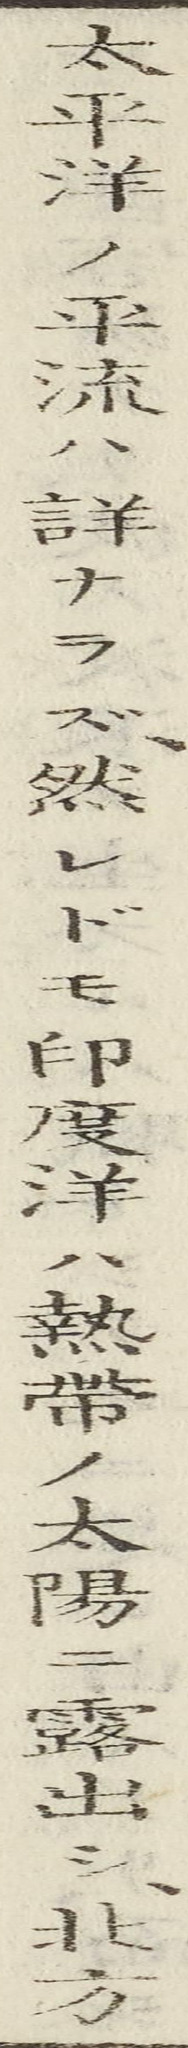太平洋ノ平流ハ詳ナラズ、然レドモ印度洋ハ熱帯ノ太陽ニ露出シ、北方
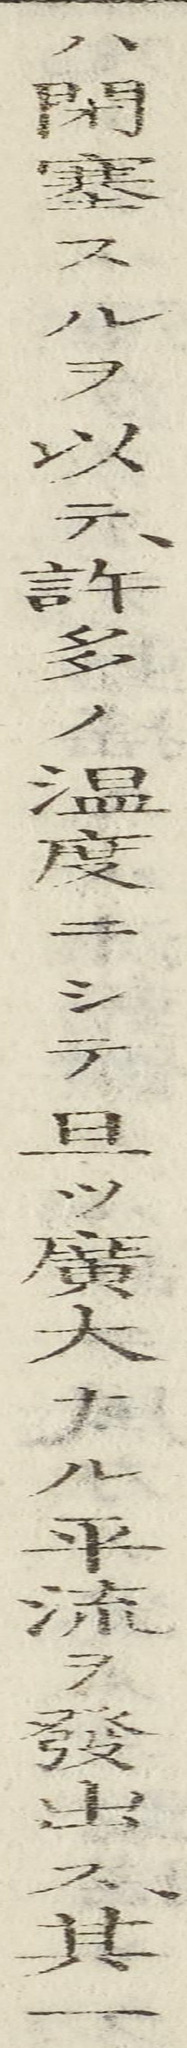ハ閉塞スルヲ以テ、許多ノ温度ニシテ且ツ広大ナル平流ヲ発出ス、其一
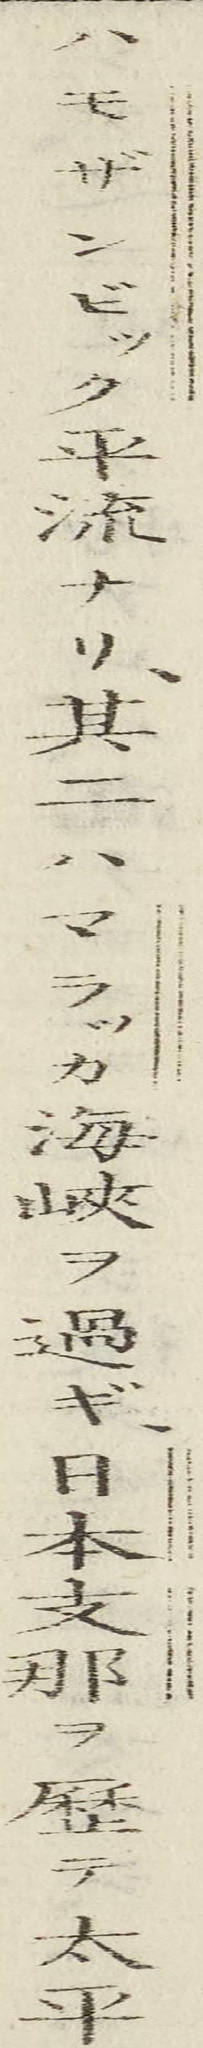ハモザンビック平流ナリ、其二ハマラッカ海峡ヲ過ギ、日本支那ヲ歴テ太平
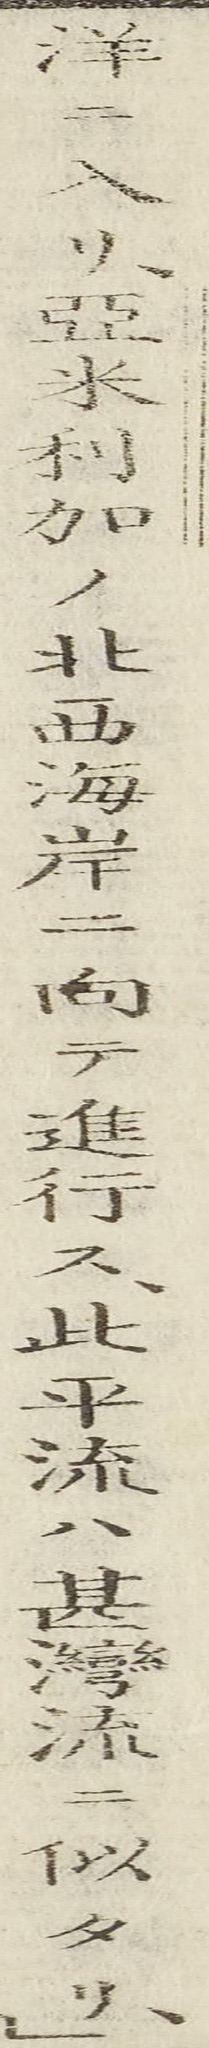洋ニ入リ、亜米利加ノ北西海岸ニ向テ進行ス、此平流ハ甚湾流ニ似タリ、」
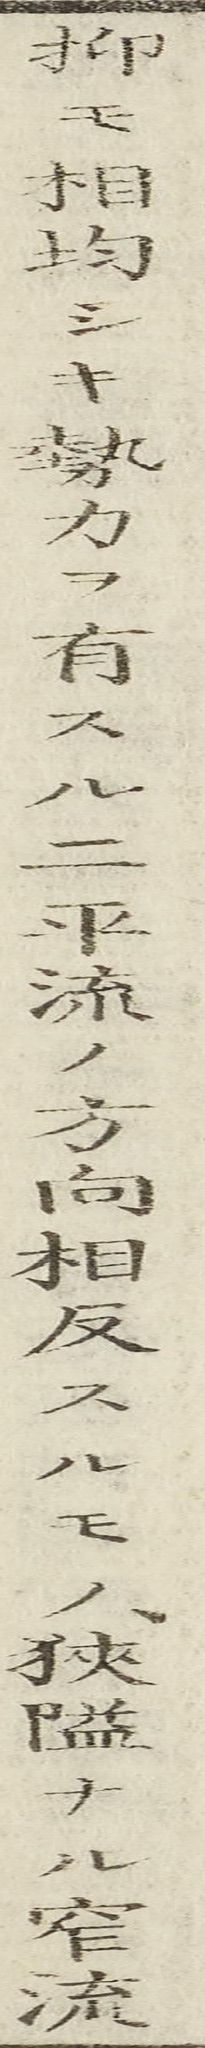抑モ相均シキ勢力ヲ有スルニ平流ノ方向相反スルモノ、狭隘ナル窄流
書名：百科全書　地文學　全
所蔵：東京大学地震研究所図書室 Earthquake Research Institute Library, The University of Tokyo, JAPAN
